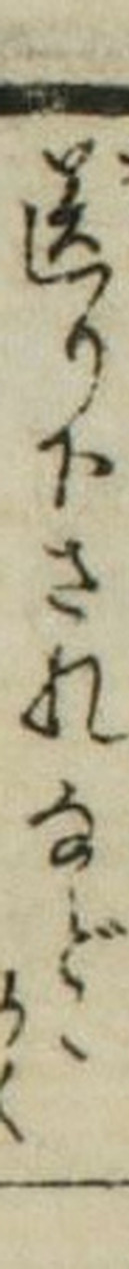送り下されなどゝかく
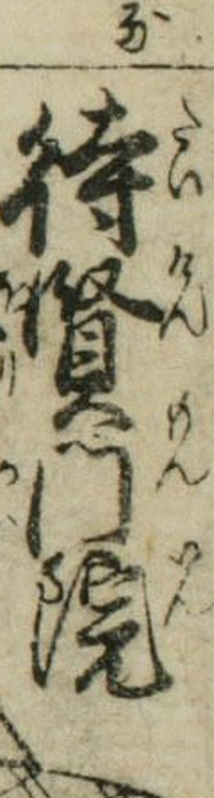待賢門院
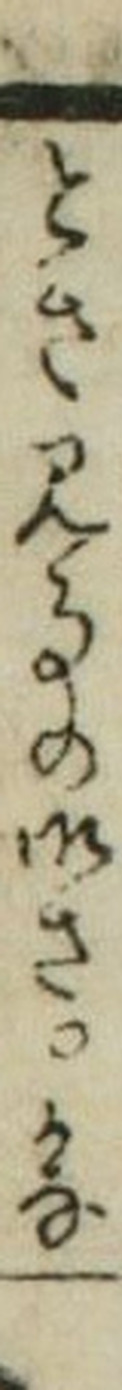とき見事の御さ。かなと
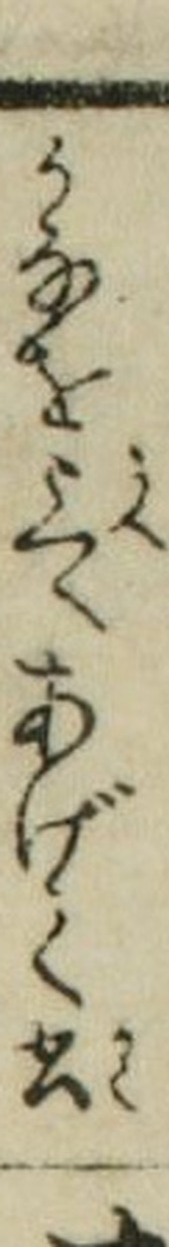かなを上へあげて書
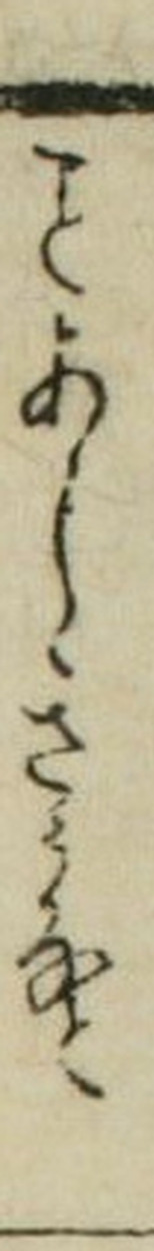ことあしゝさかなと
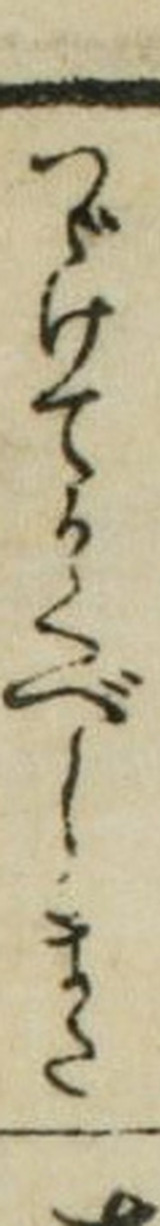つゞけてかくべしまた
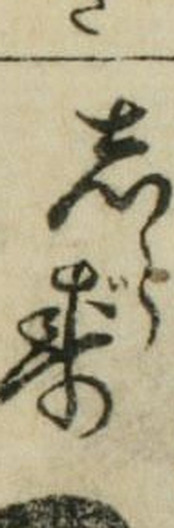しらず
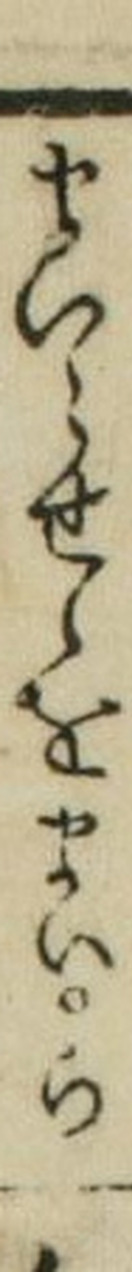まいらせ候をまい。ら
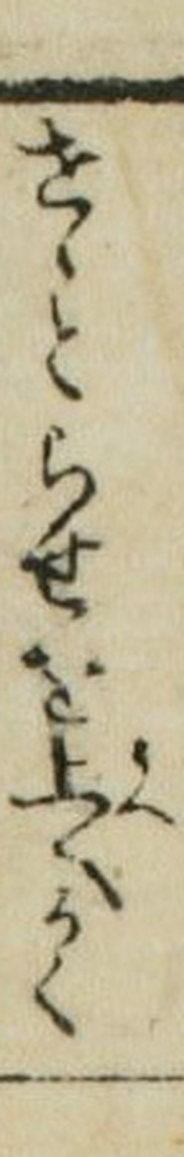せ候とらせを上へかく
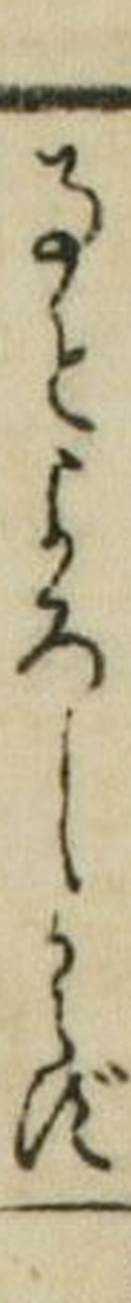事もよろしからず
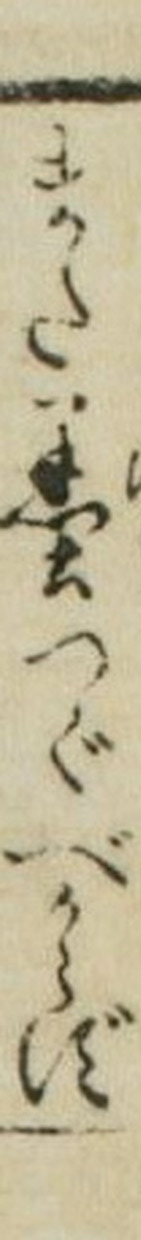また墨つぐべからず
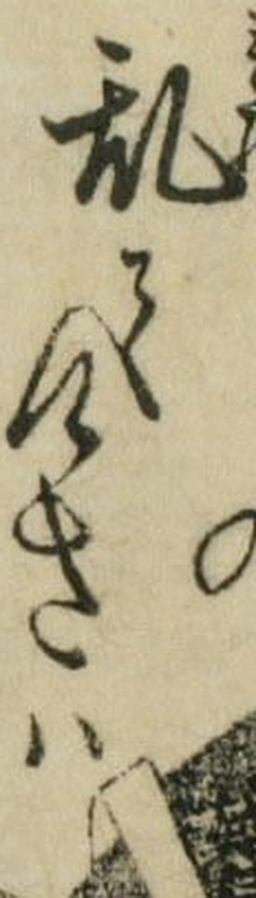けさは
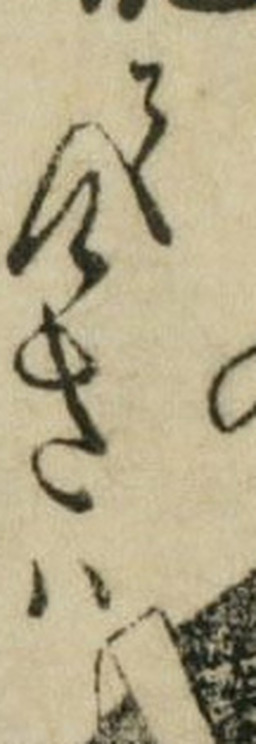けさは
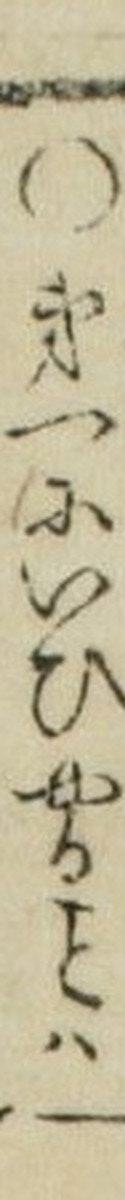○第一にいひやることは
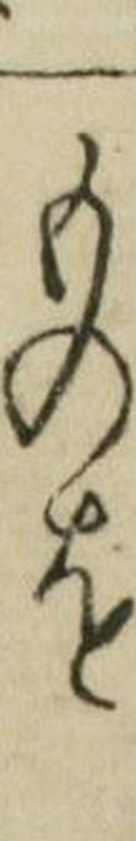ものを
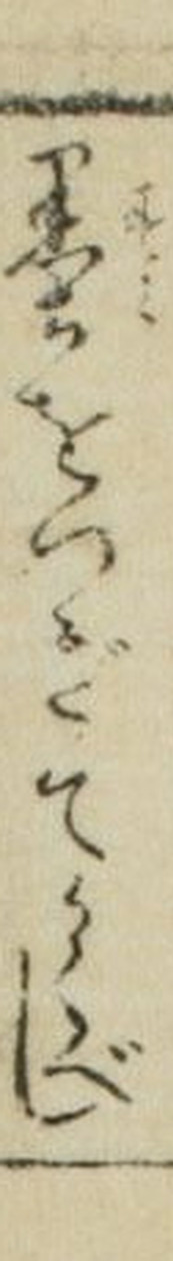墨をつぎてかくべし
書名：百人一首
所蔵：東京学芸大学教育コンテンツアーカイブ
